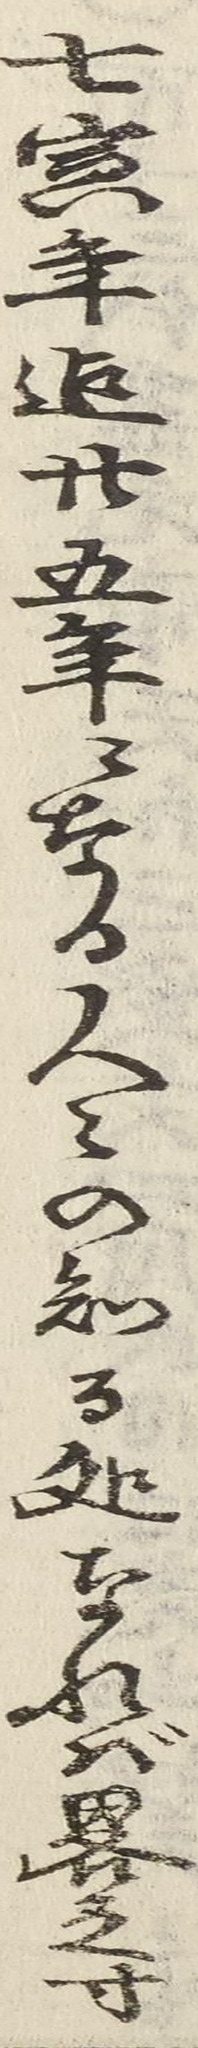七寅年迄廿五年になる人々の知る処なれば略之す
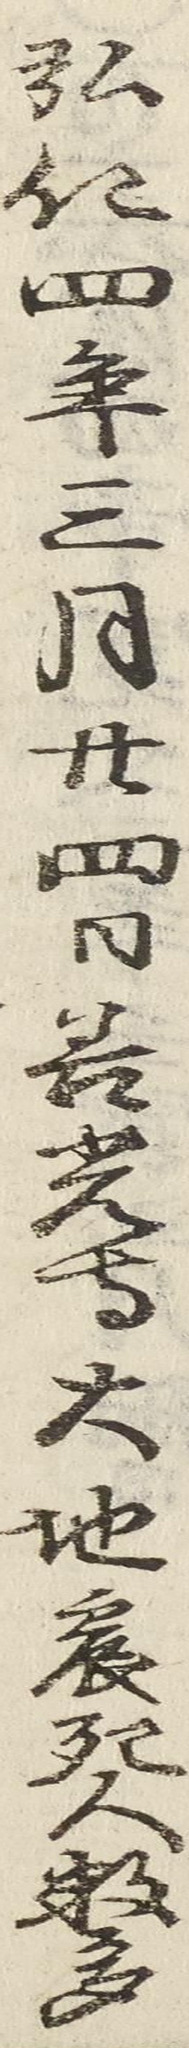弘化四年三月廿四日善光寺大地震死人数多
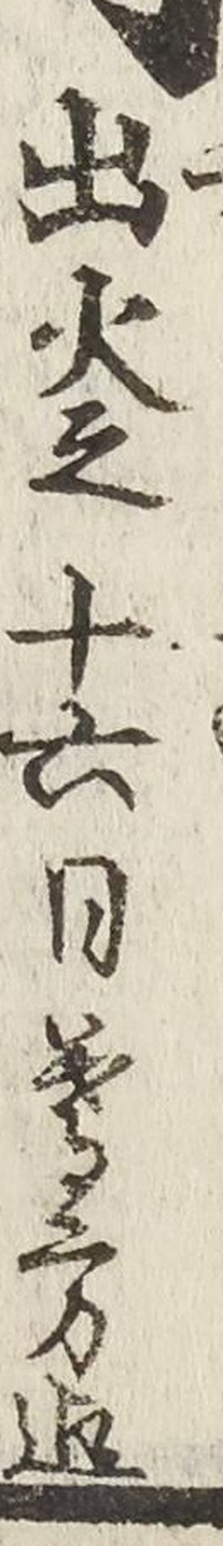出火之十六日暮方迄
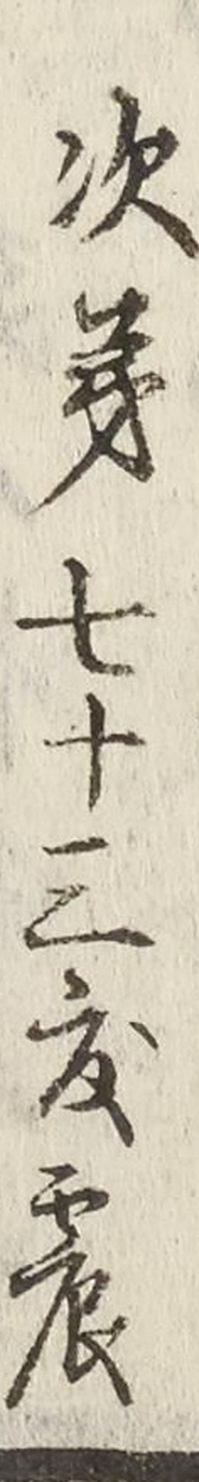次第七十三度震
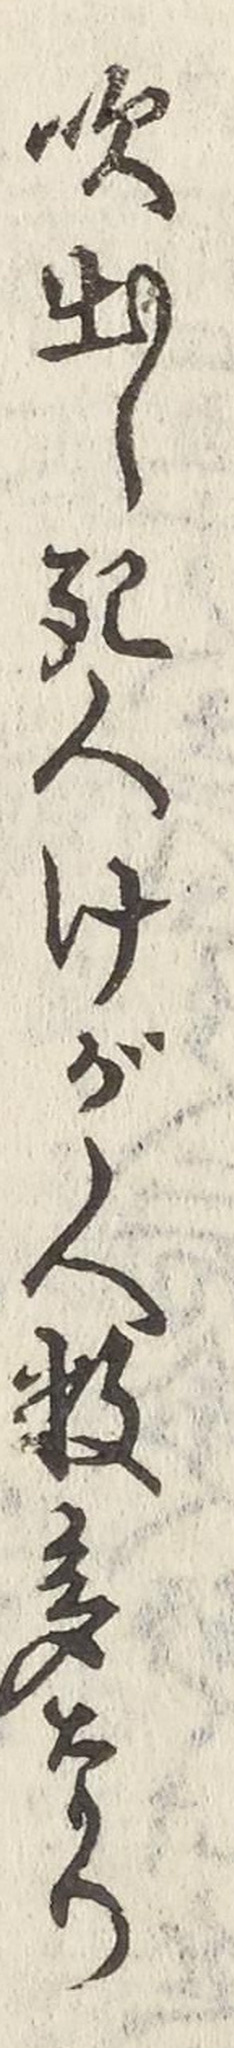吹出し死人けが人数多なり
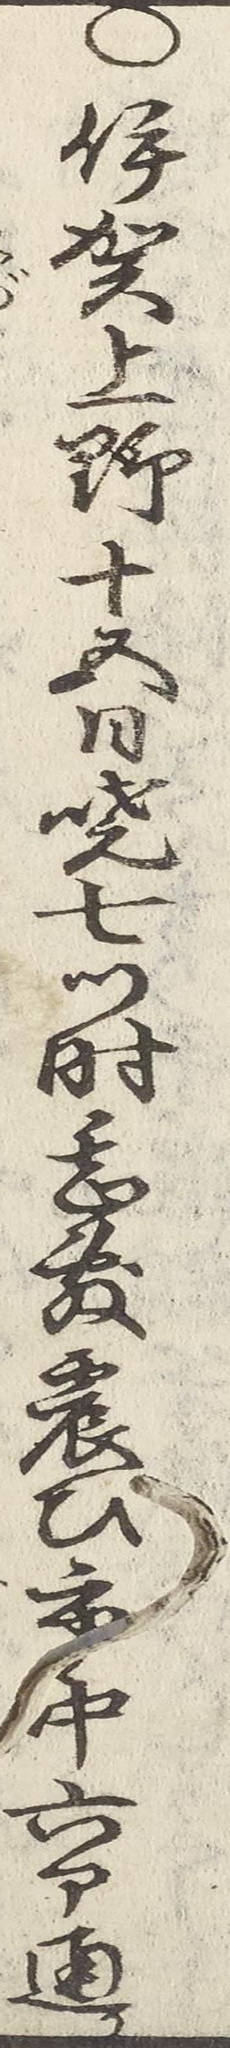○伊賀上野十五日暁七ツ時甚敷震ひ市中六分通り

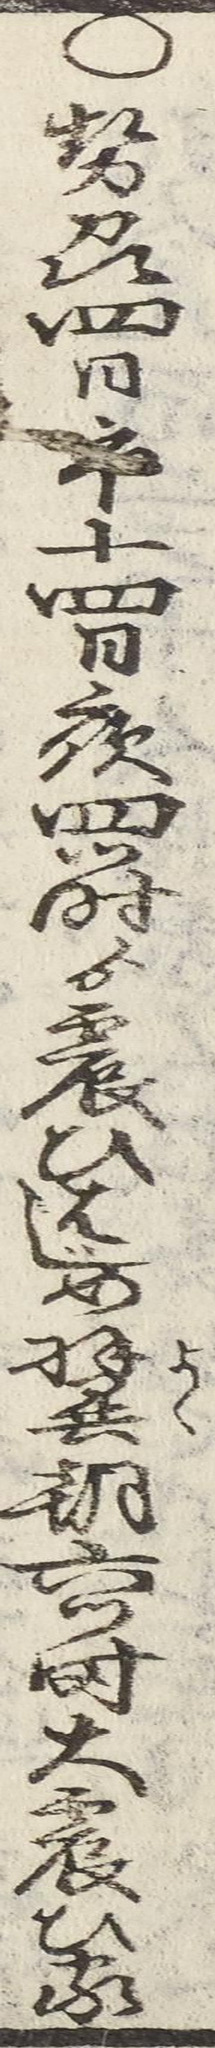○勢州四日市十四日夜四ツ時ゟ震ひはじめ翌よく朝六ツ時大震ひ家
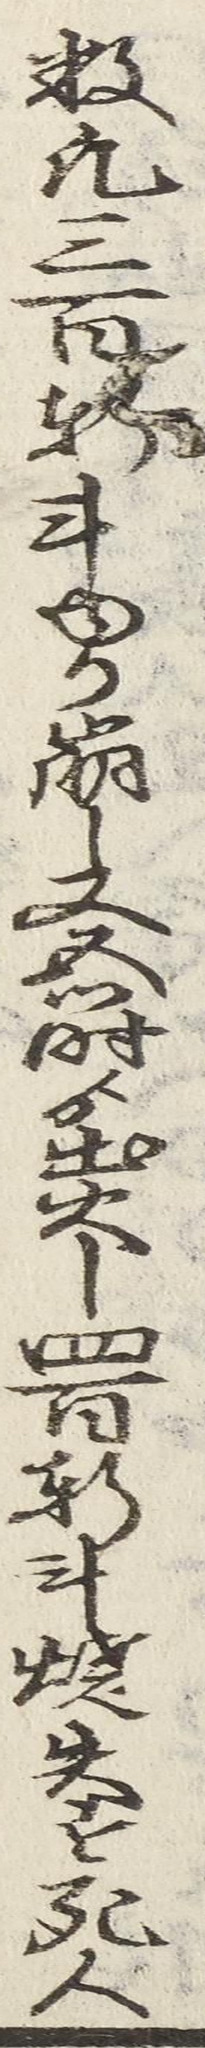数凡三百軒斗ゆり崩し又五ツ時ゟ出火し四百軒斗焼失す死人
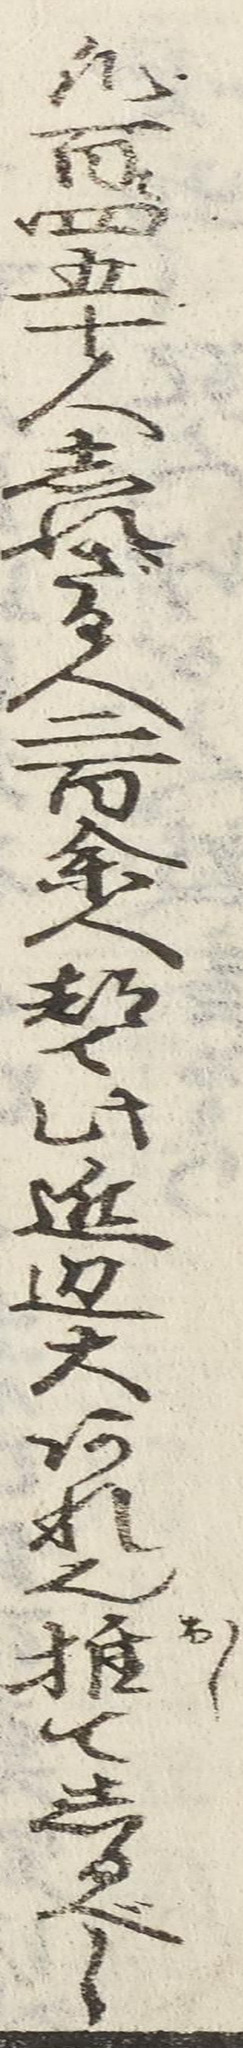凡百四五十人しれざる人二百余人都て此近辺大あれ也推おしてしるべし
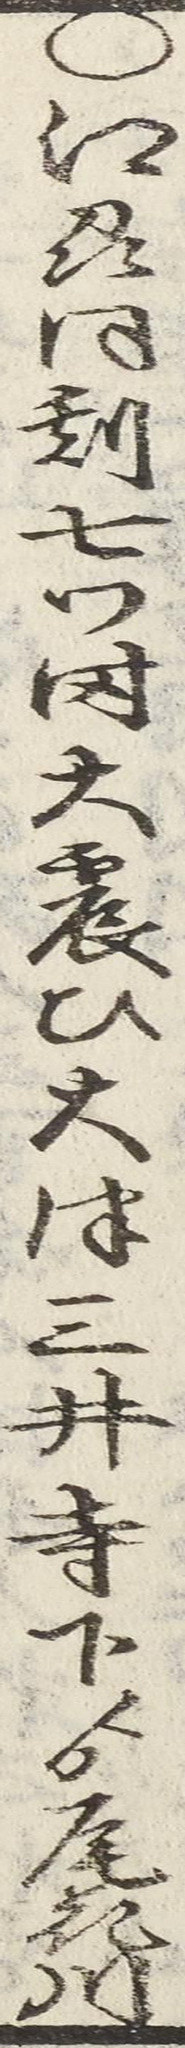○江州同刻七ツ時大震ひ大津三井寺下ゟ尾花川
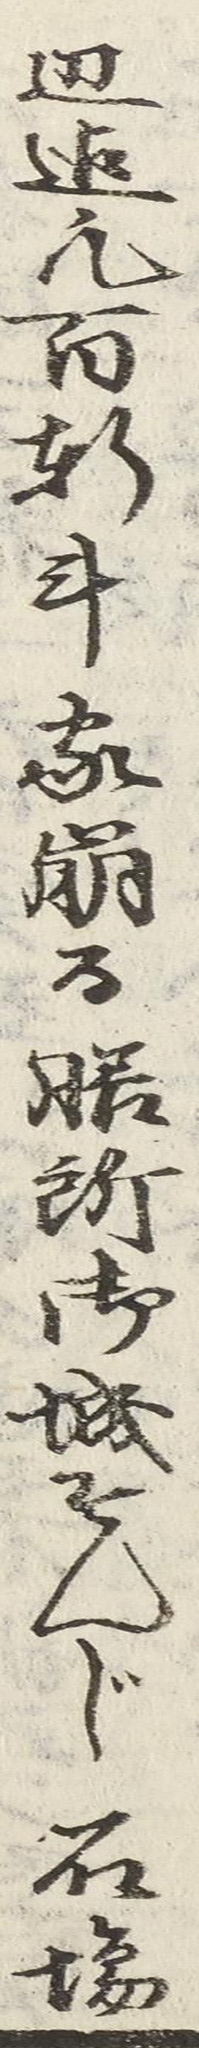辺迄凡百軒斗家崩る膳所御城そんじ石場
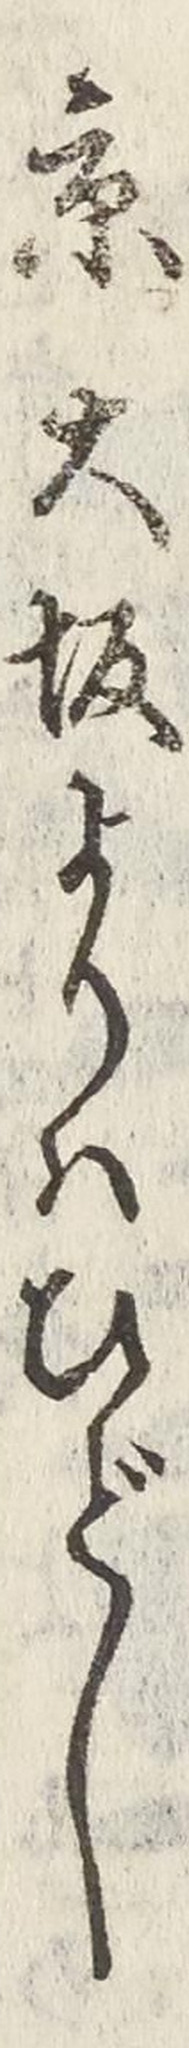京大坂よりはひどし
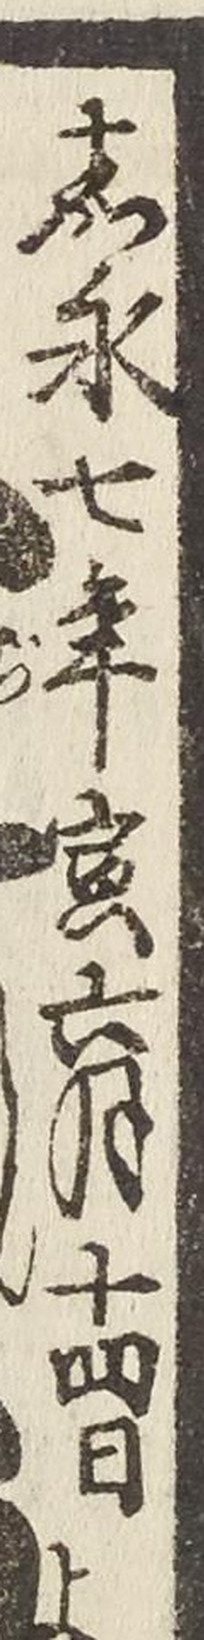嘉永七年寅六月十四日
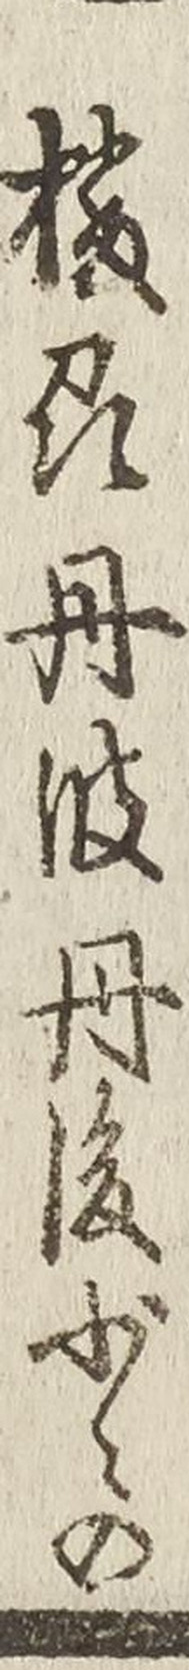播州丹波丹後少々の
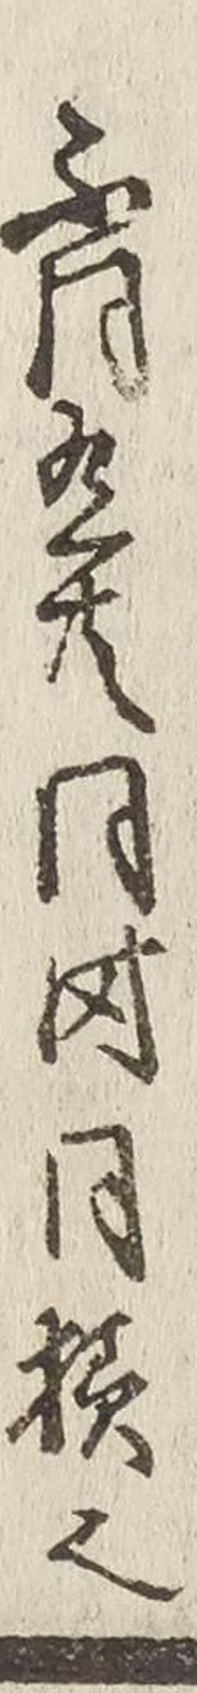不同有共同時同様也
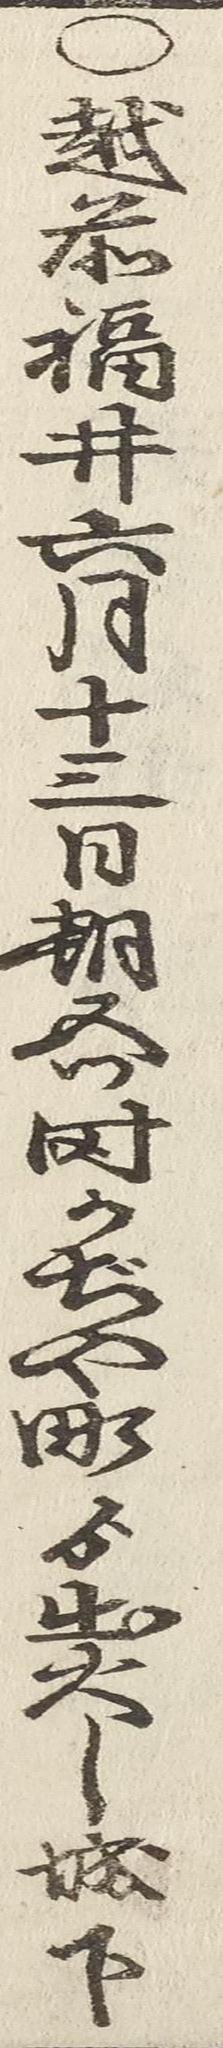○越前福井六月十三日朝五ッ時かぢや町ゟ出火し城下
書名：大地震世直仕艸紙
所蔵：東京大学地震研究所図書室 Earthquake Research Institute Library, The University of Tokyo, JAPAN
